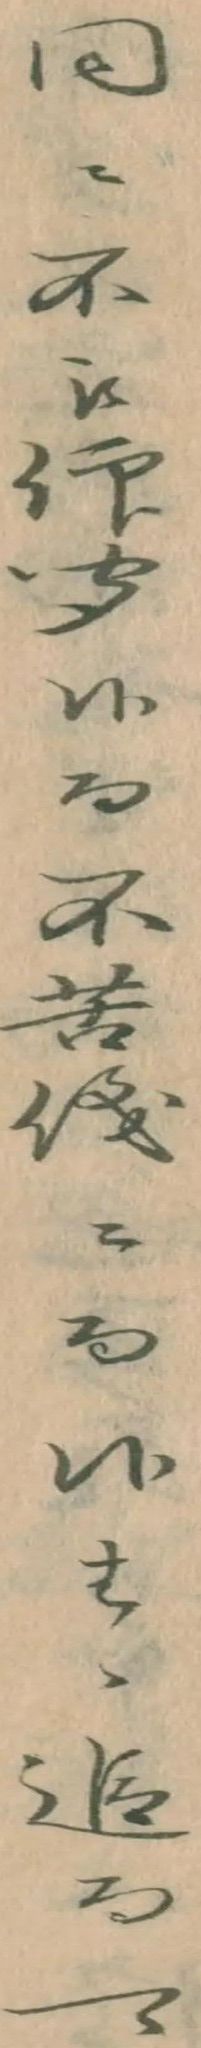同に不被仰聞候而不苦儀に而候者々追而可

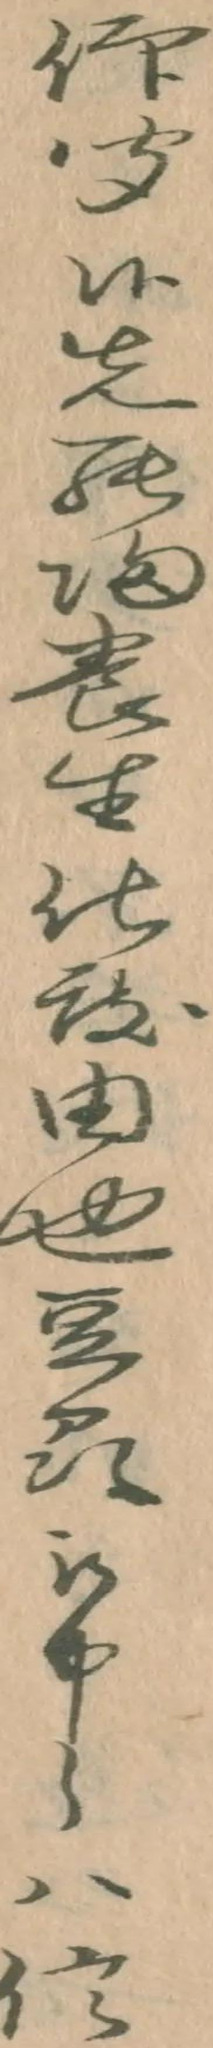仰聞候先罷帰養生仕度由也豆州被申しは信
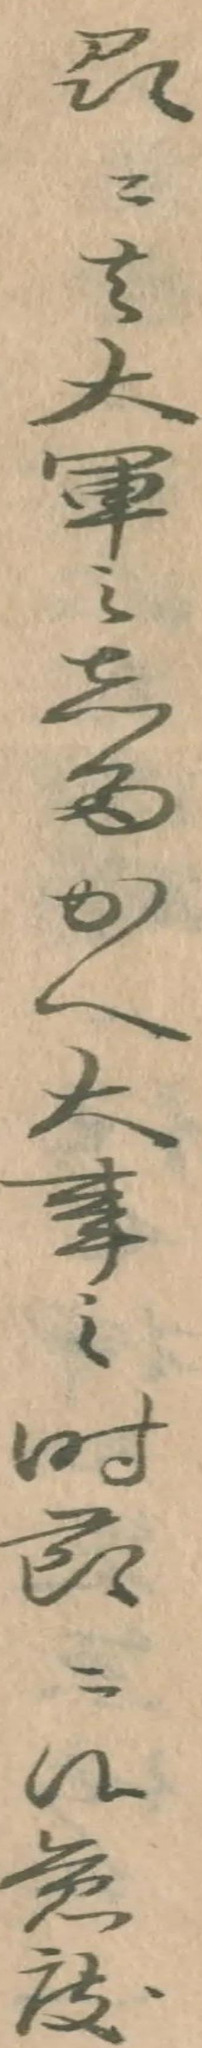州に者大軍之志多かへ大事之時節に候急度
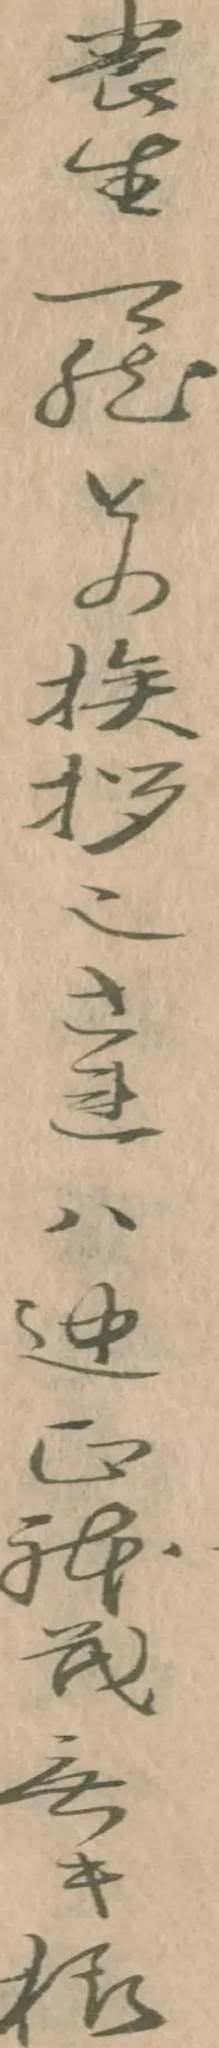養生可然との挨拶也さ連は迚正躰茂無き様
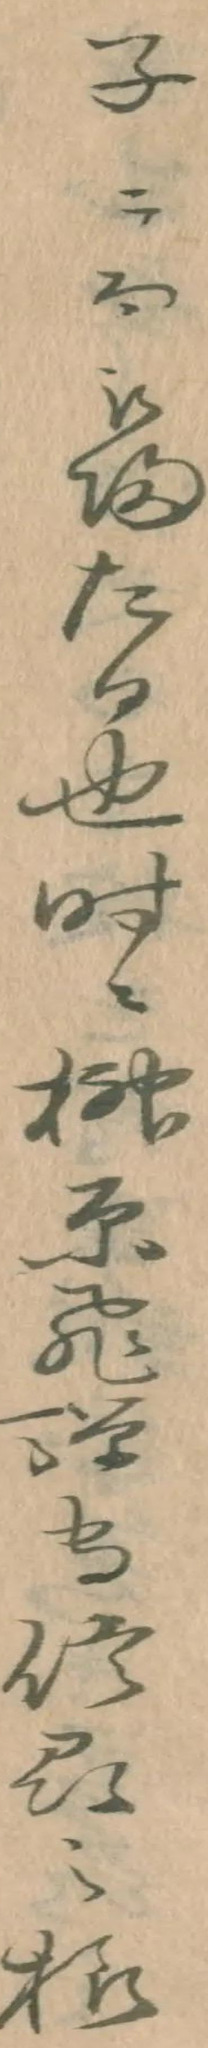子に而被帰たる也時に柳原飛騨守信州之様
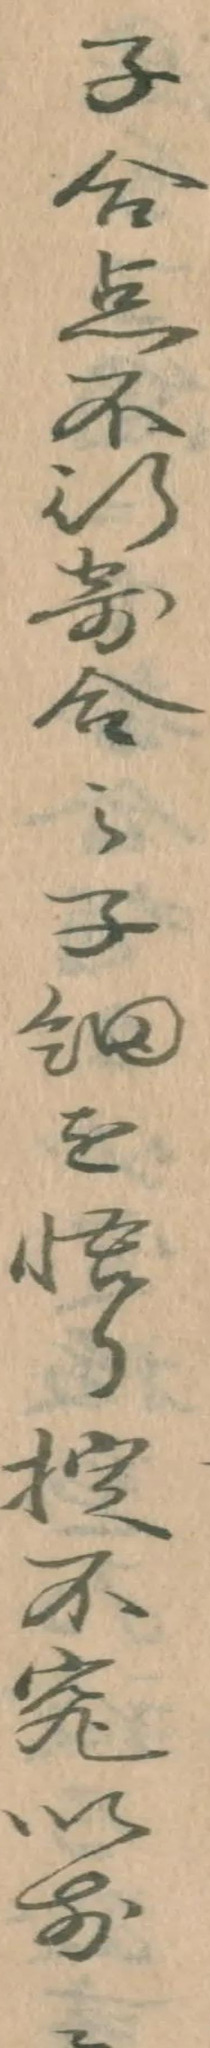子合点不行寄合之子細を悟り掟不究以前に
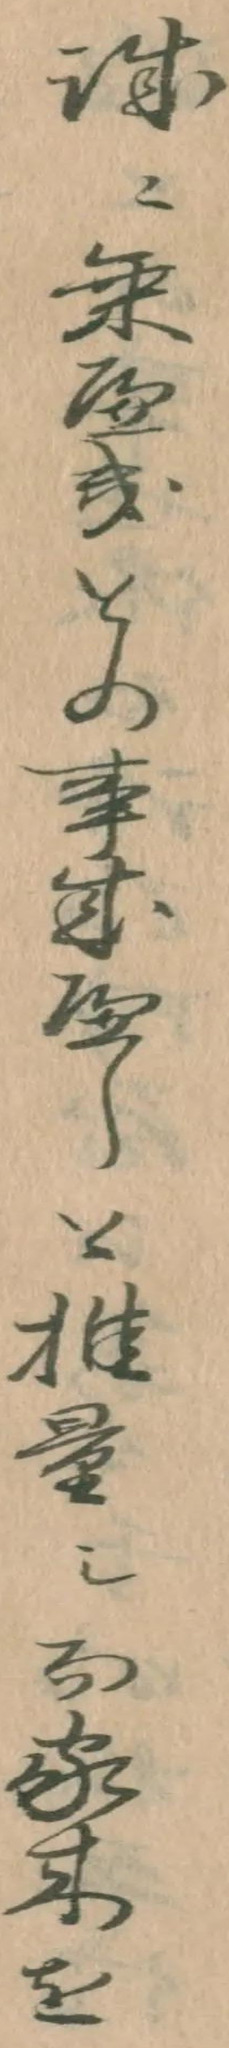誠に乗扁義との事成扁しと推量し而家来を
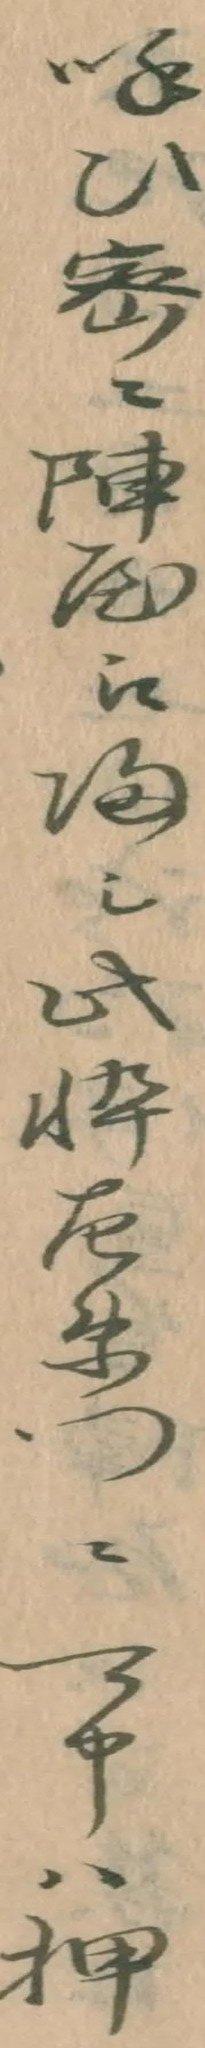呼ひ密に陣屋江帰し此忰左衛門に可申は押
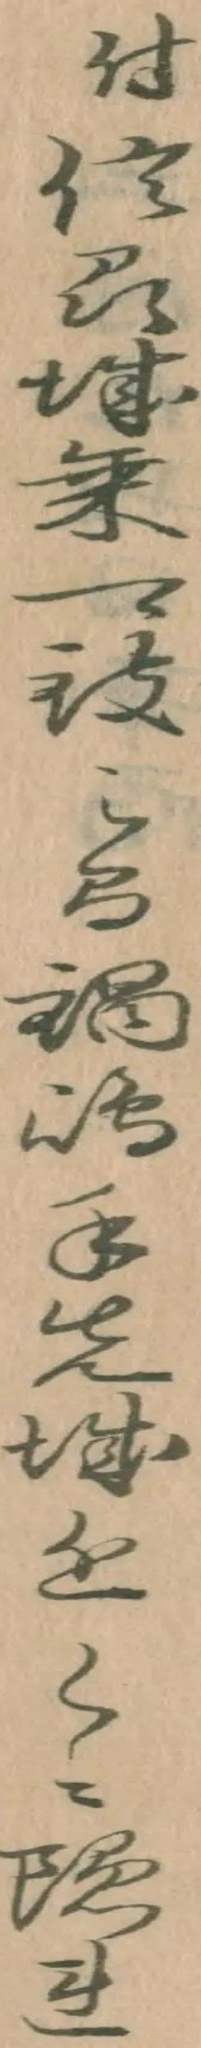付信州城乗可致之間鍋島手先城近くに隠連
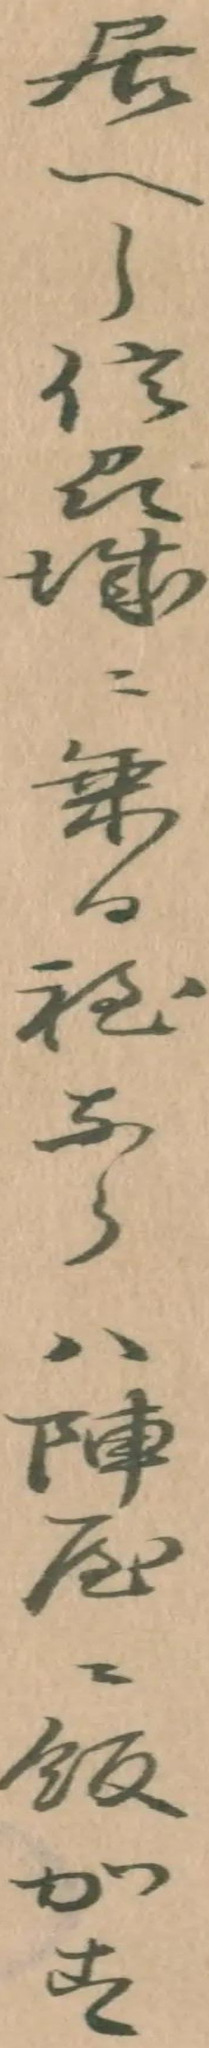居へし信州城に乗る程ならは陣屋に飯加春
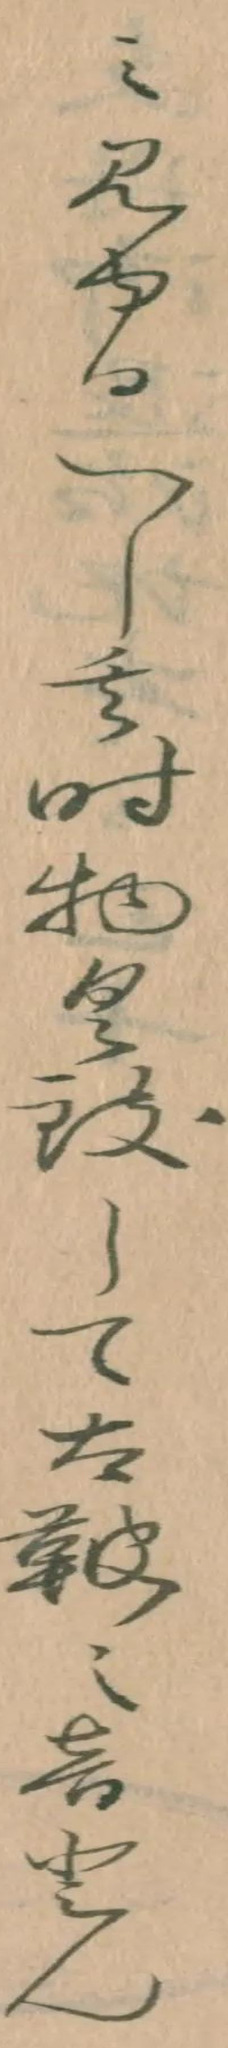之見ゆるへし其時物具致して太皷之音登ん
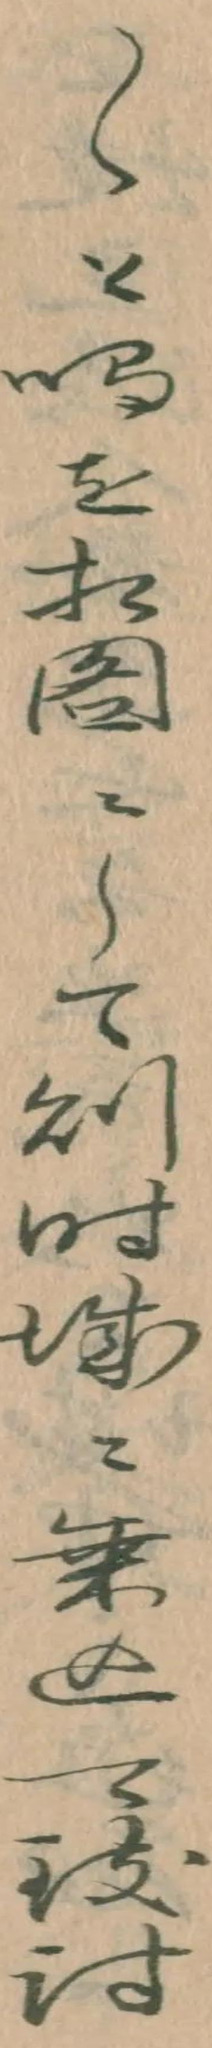〳〵と鳴を相図にして則時城に乗込可致討
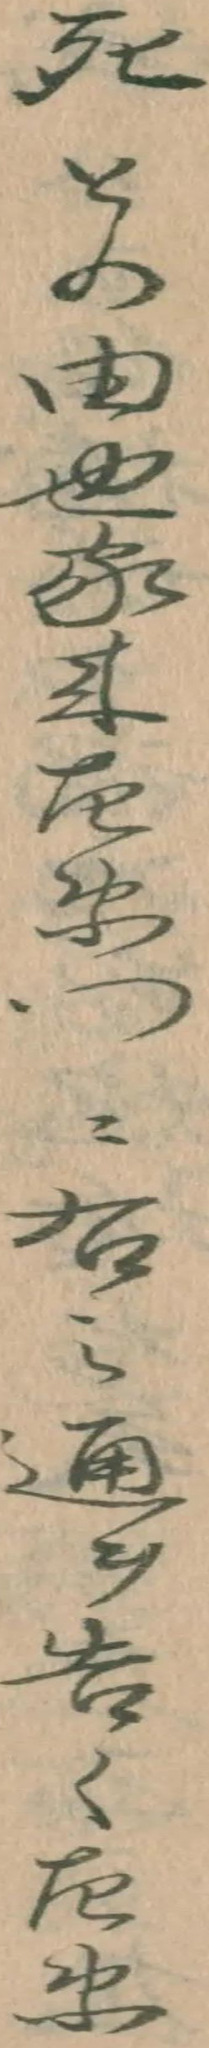死との由也家来左衛門に右之通を告く左衛
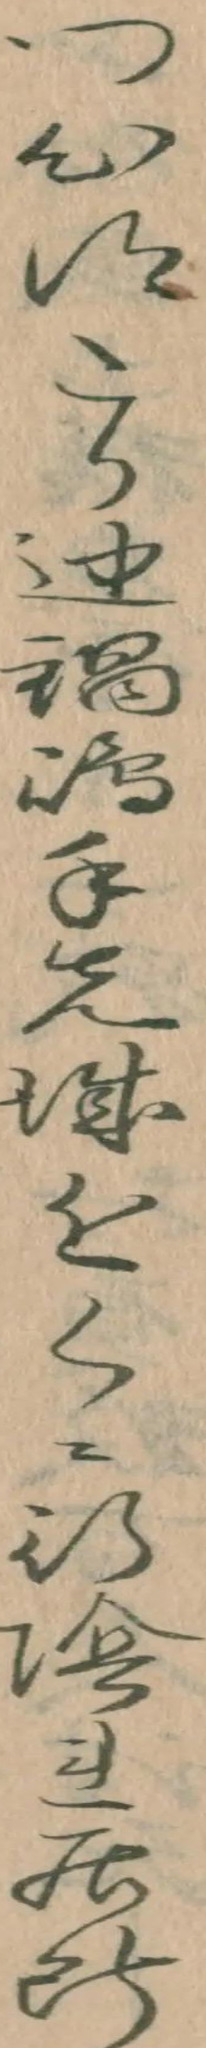門心得たり迚鍋島手先城近くに行陰連居新
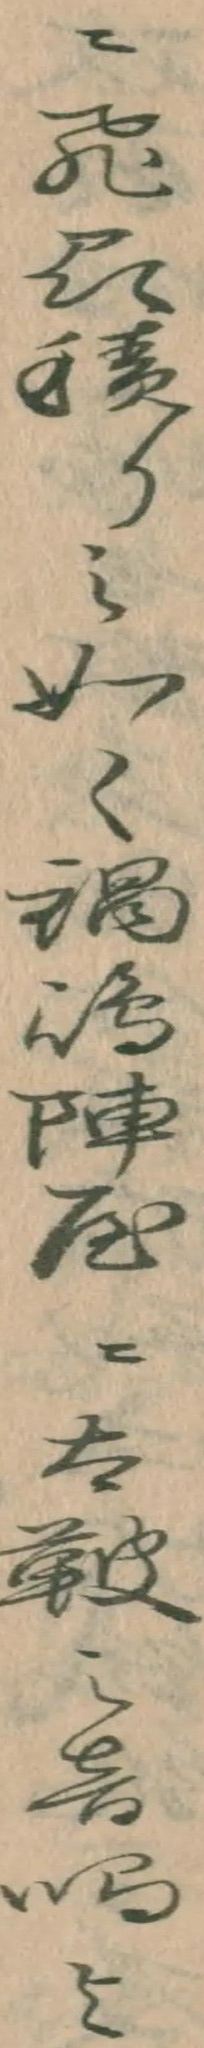に飛州積り之如く鍋島陣屋に太皷之音鳴与
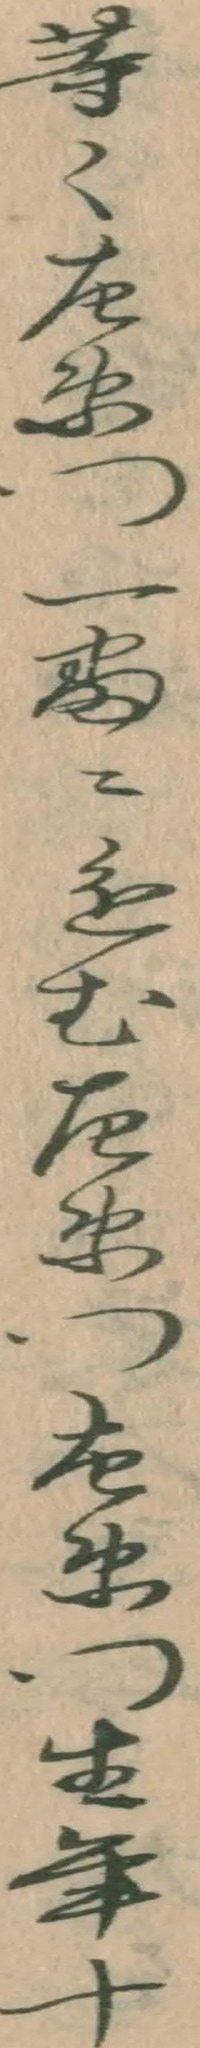等く左衛門一番に進む左衛門左衛門生年十
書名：切支丹御退治記 49巻. [7]
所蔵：国立国会図書館 National Diet Library, JAPAN
